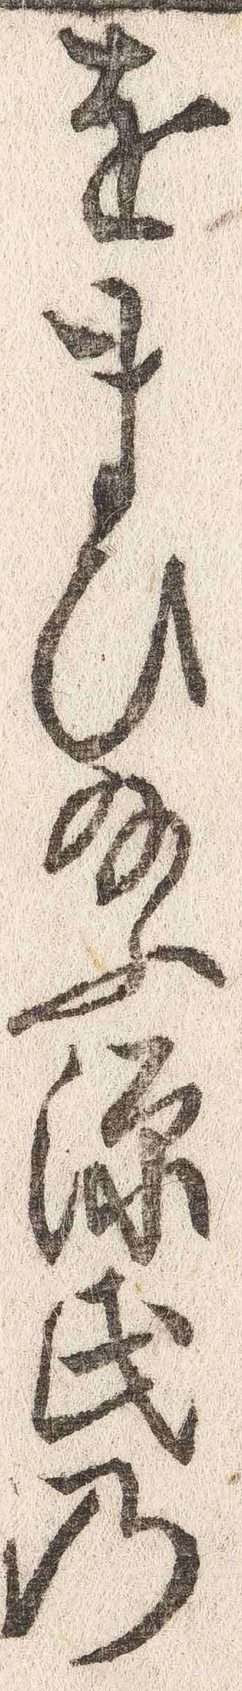をまひ給ふ源氏の
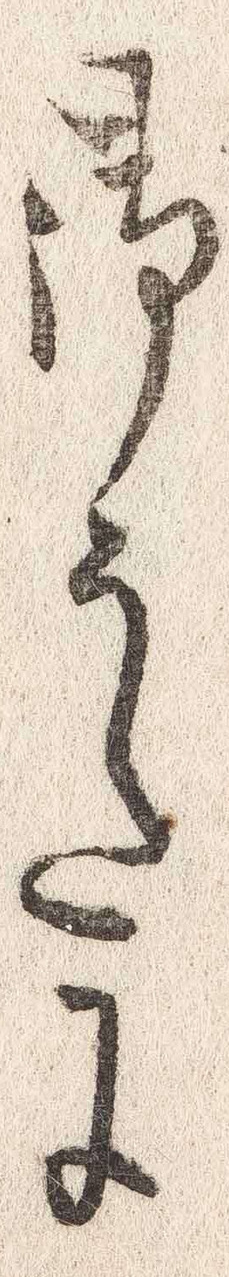御うたに
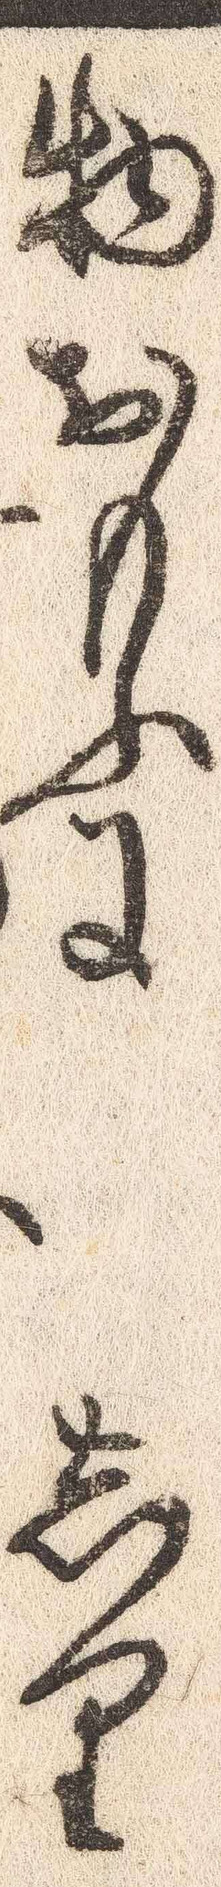物おもふにしり
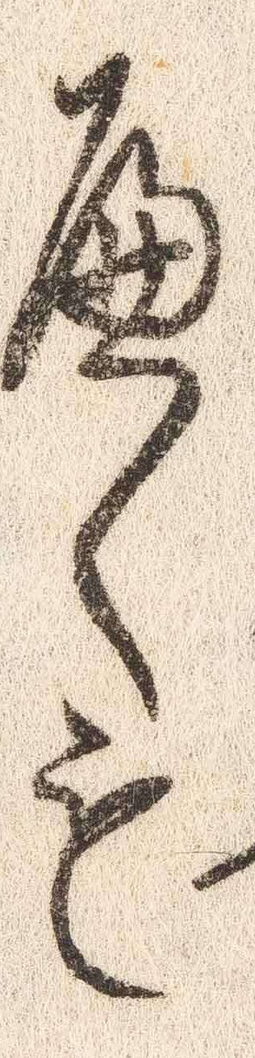へくも
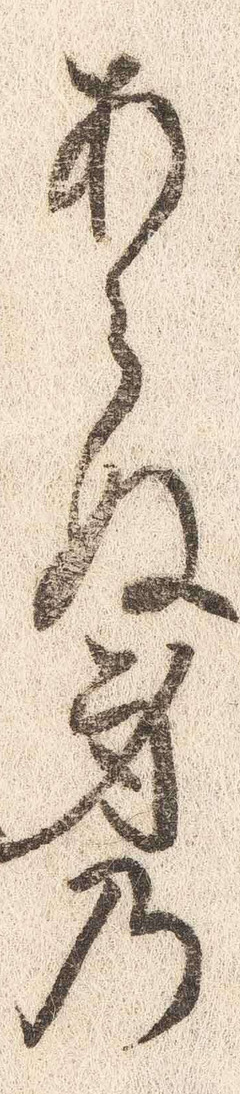あらぬ身の
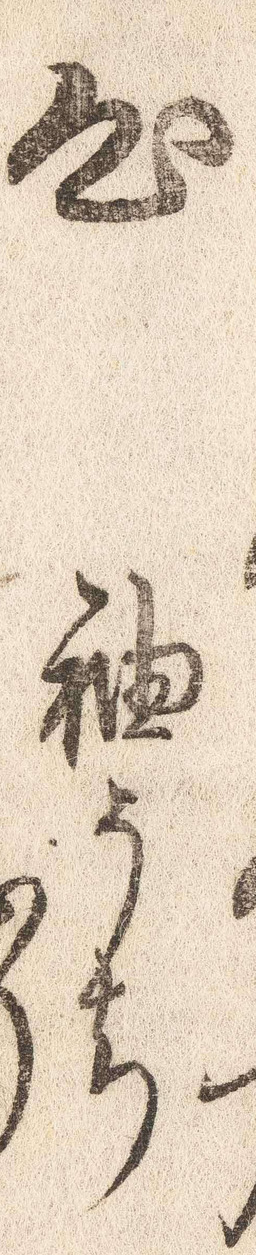心袖うち

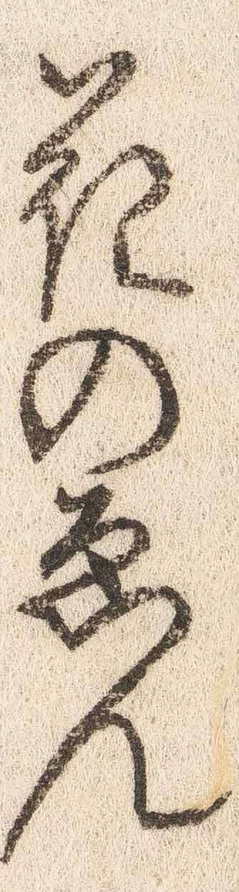花のゑん
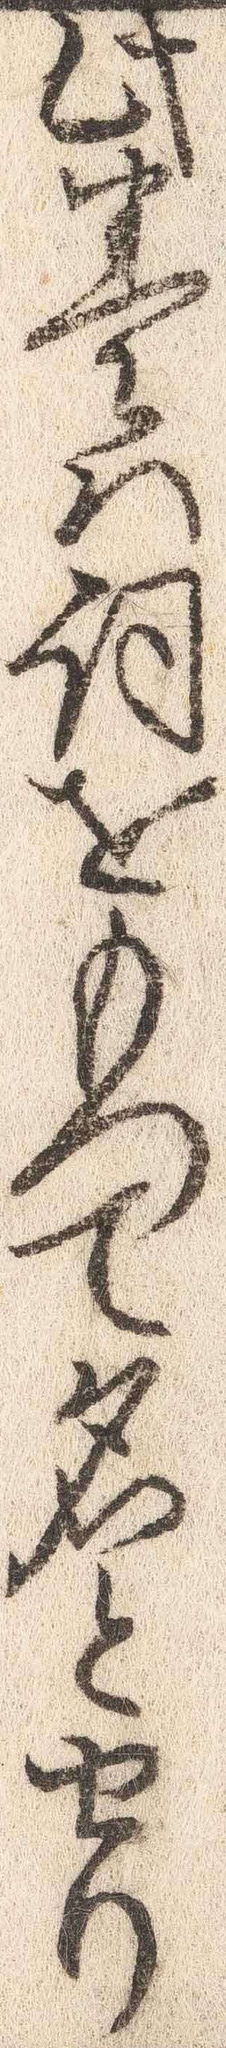此巻は詞をもつて名とせり
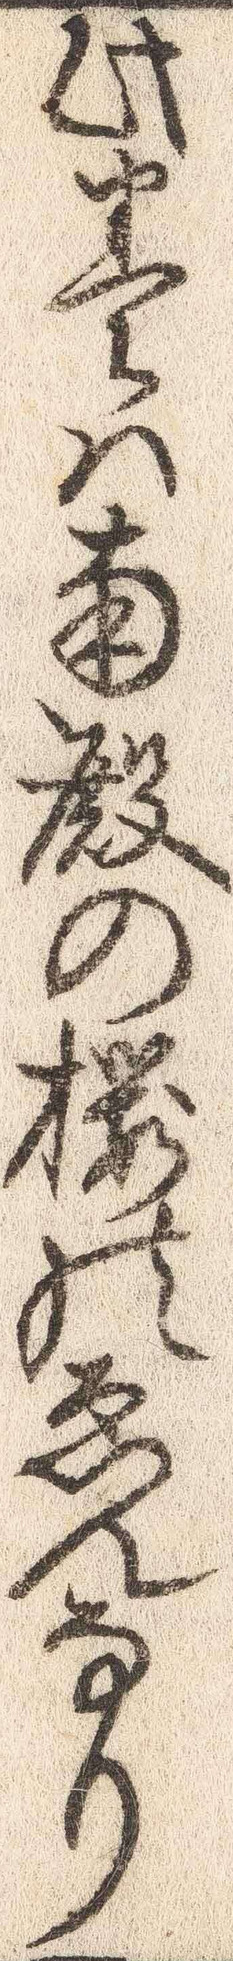此巻は南殿の桜のゑんなり
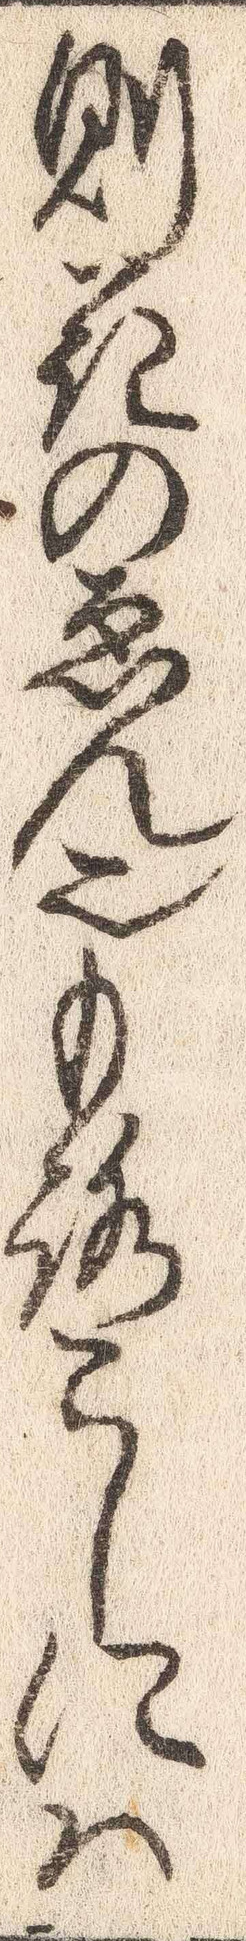則花のゑん也もろこしには
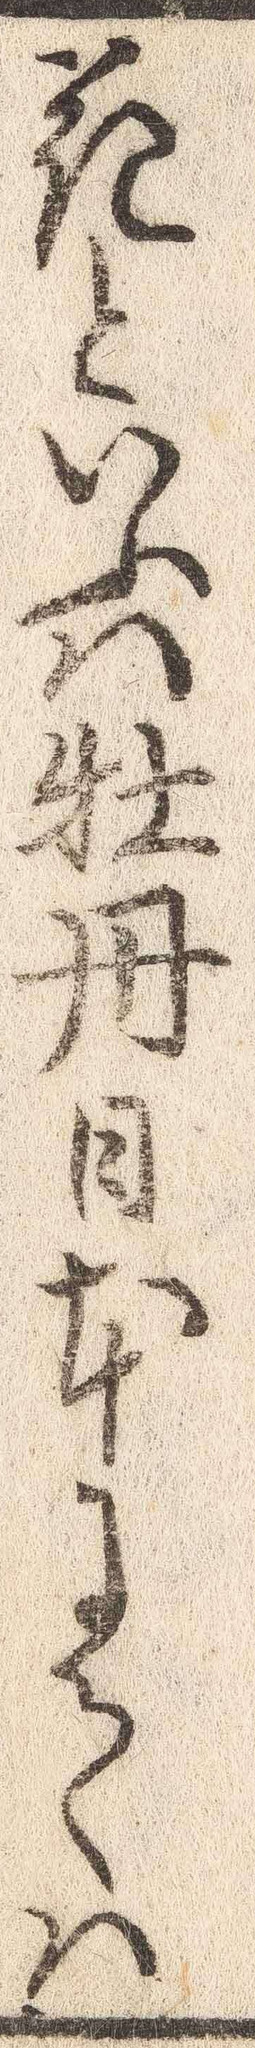花といふは牡丹日本にては
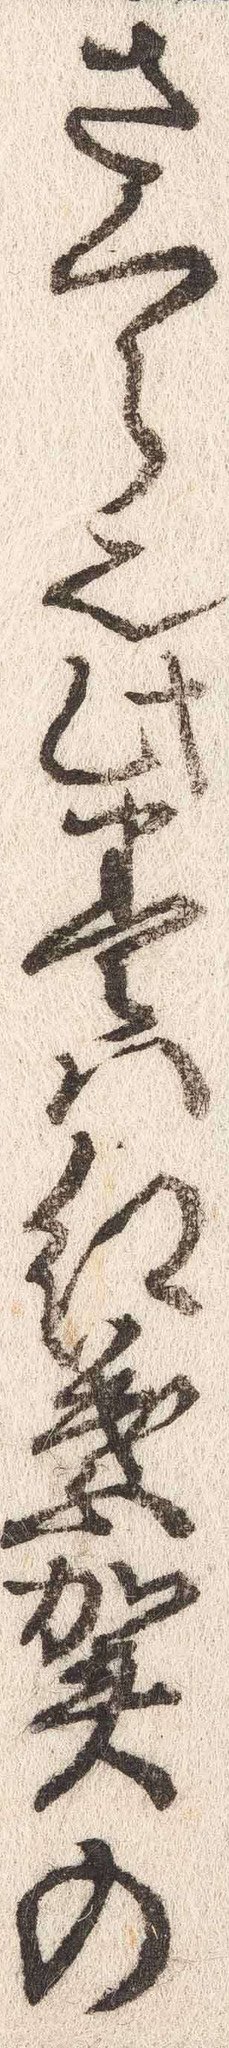さくら也此巻は紅葉賀の
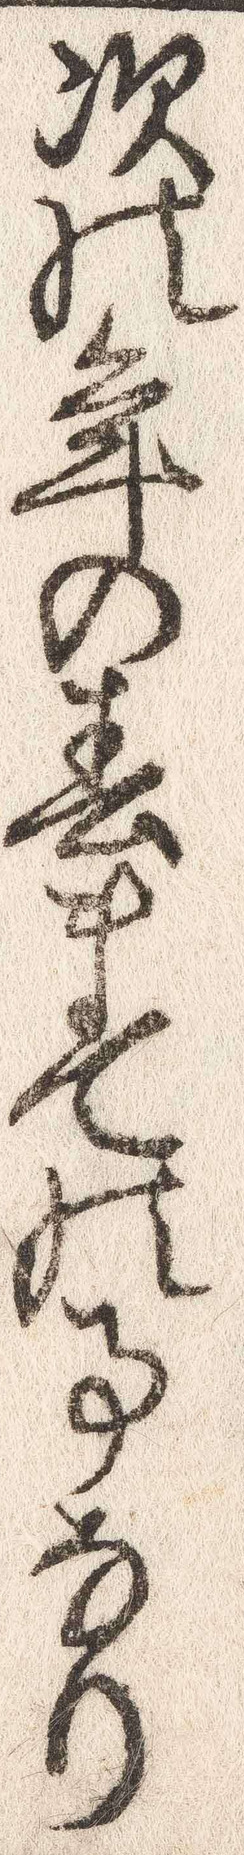次の年の春まての事なり
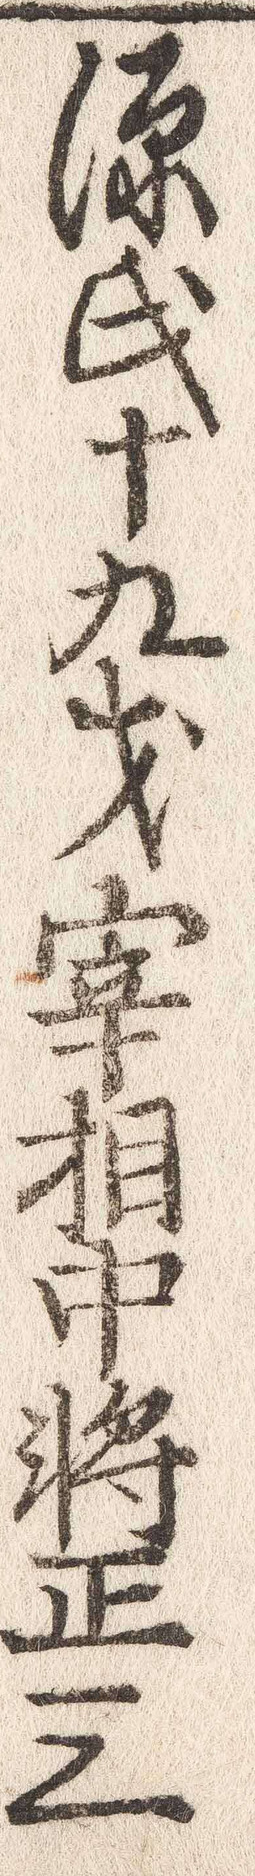源氏十九才宰相中将正三
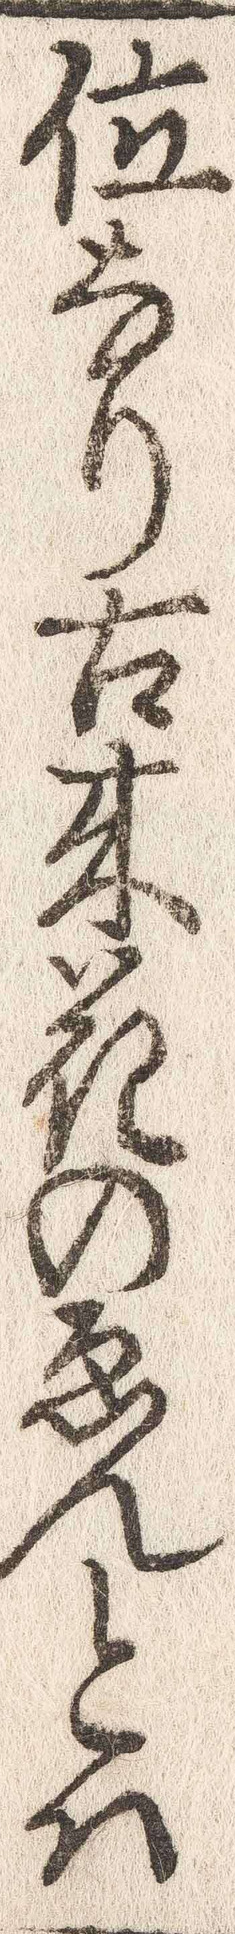位なり古来花のゑんとは
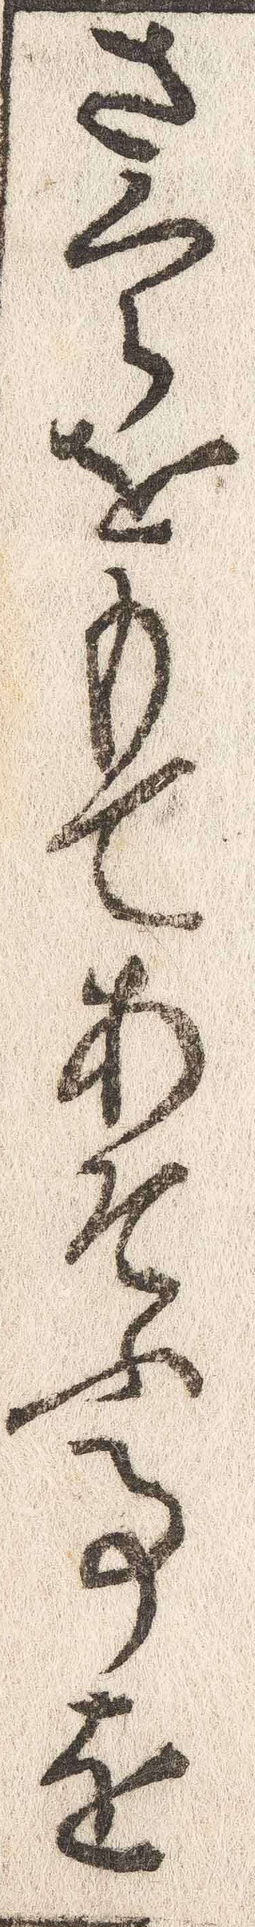さくらをもてあそふ事を
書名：源氏物語
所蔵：東京学芸大学附属図書館 国文学研究資料館
